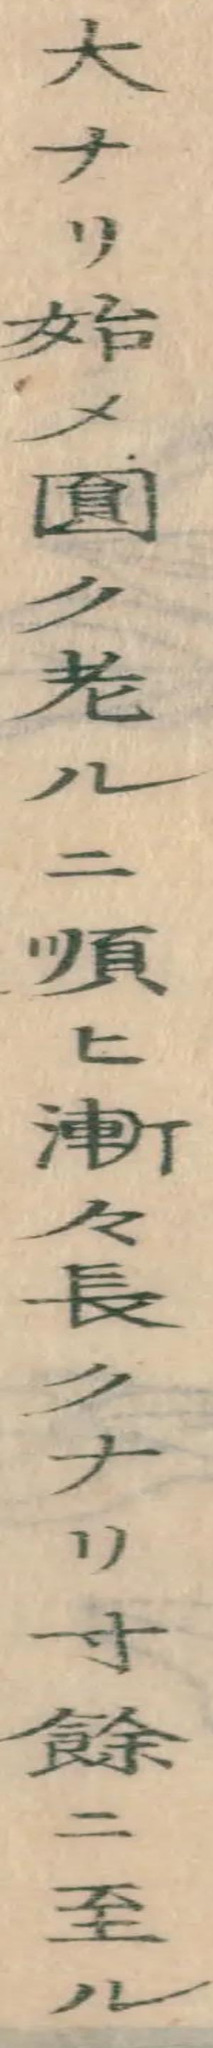大ナリ始メ円ク老ルニ順ヒ漸々長クナリ寸余ニ至ル
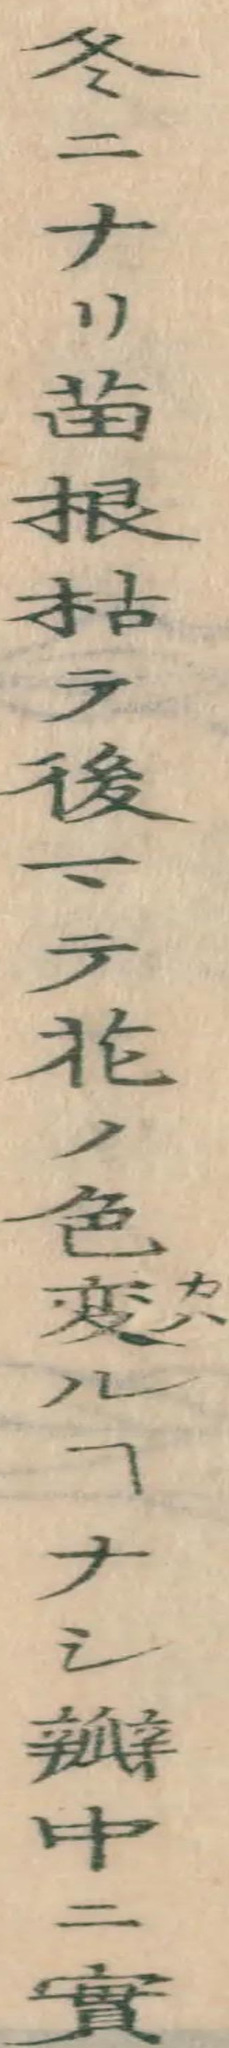冬ニナリ苗根枯テ後マテ花ノ色変ルコトナシ弁中ニ実
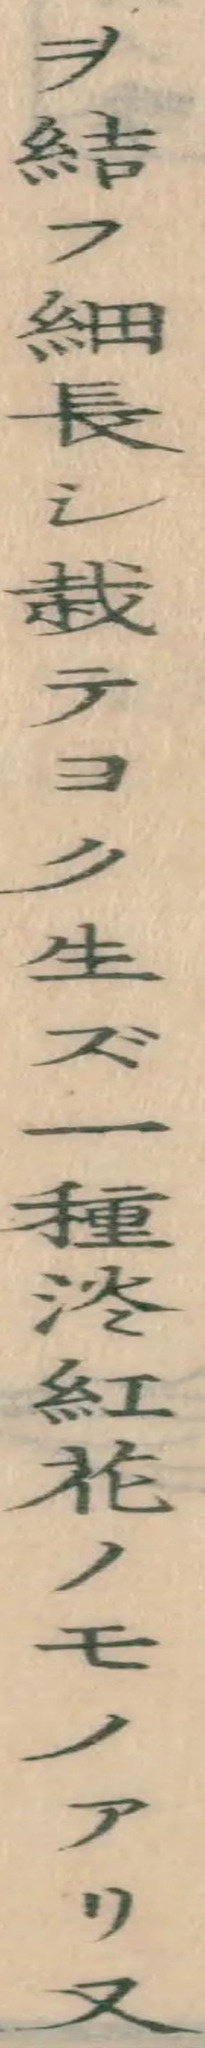ヲ結フ細長シ栽テヨク生ズ一種淡紅花ノモノアリ又
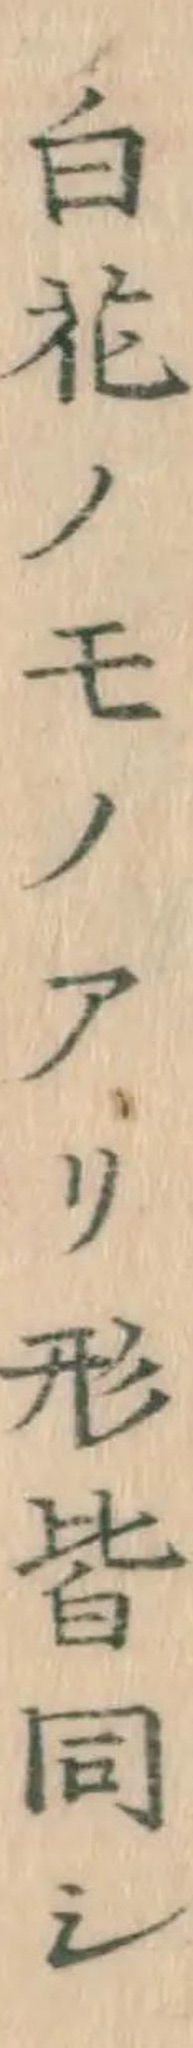白花ノモノアリ形皆同シ
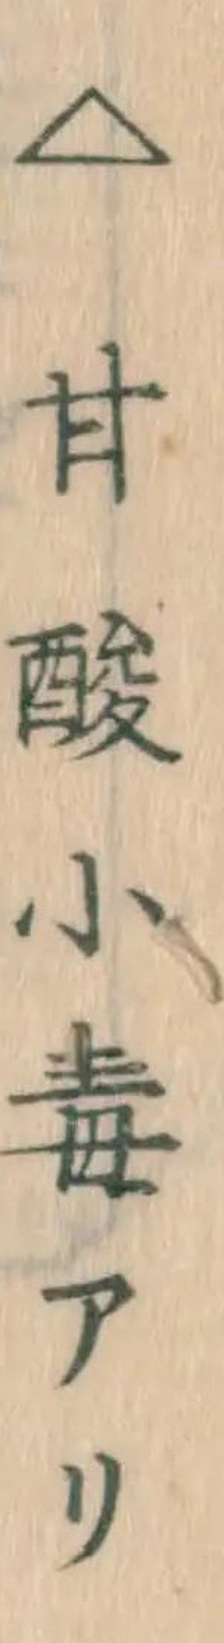△甘酸小毒アリ
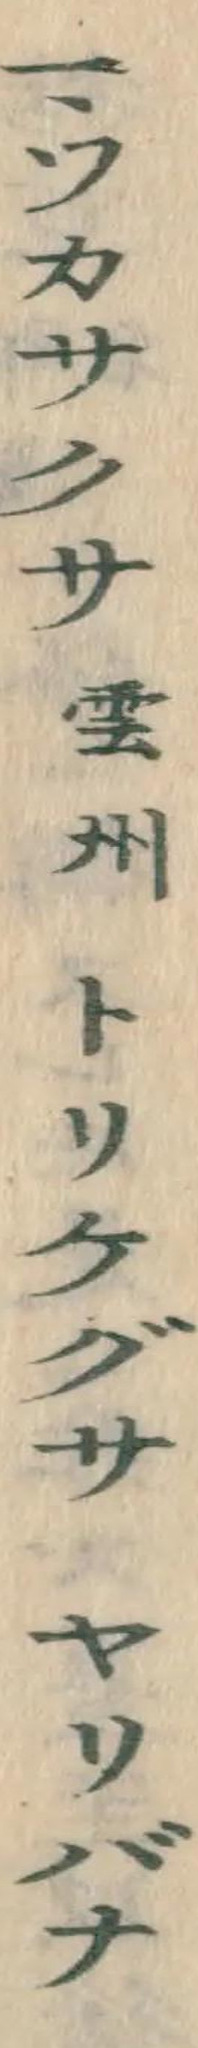マツカサクサ雲州トリケグサヤリバナ
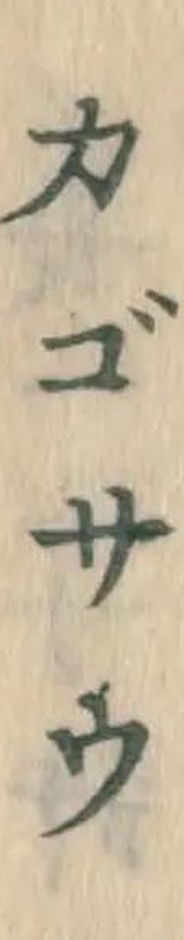カゴサウ

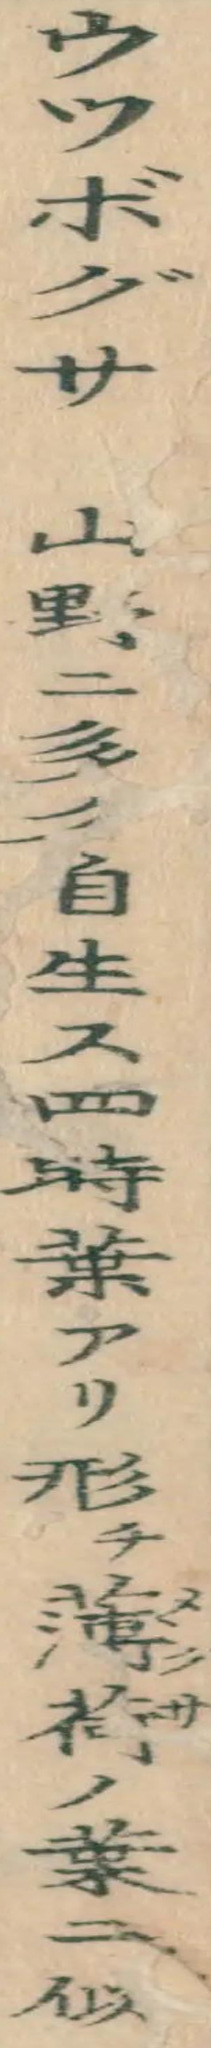ウツボグサ山野ニ多ク自生ス四時葉アリ形薄荷ノ葉ニ似
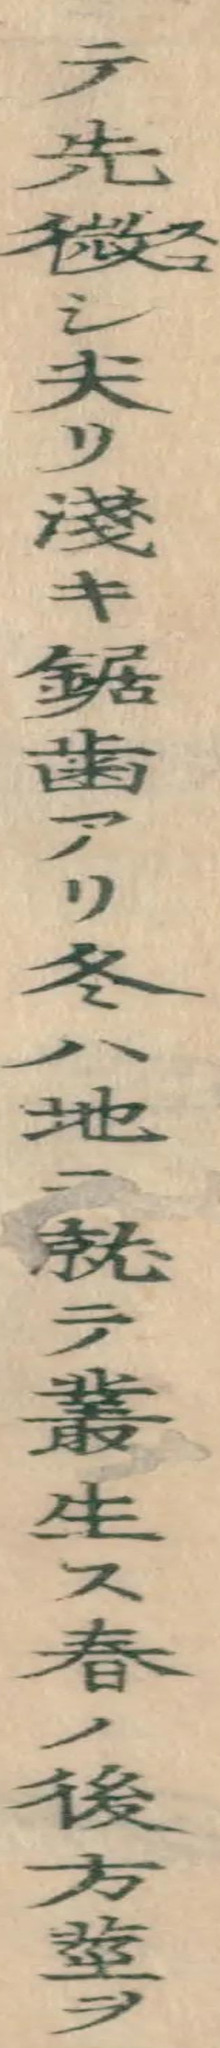テ先微シ尖リ浅キ鋸歯アリ冬ハ地ニ就テ叢生ス春ノ後方茎ヲ
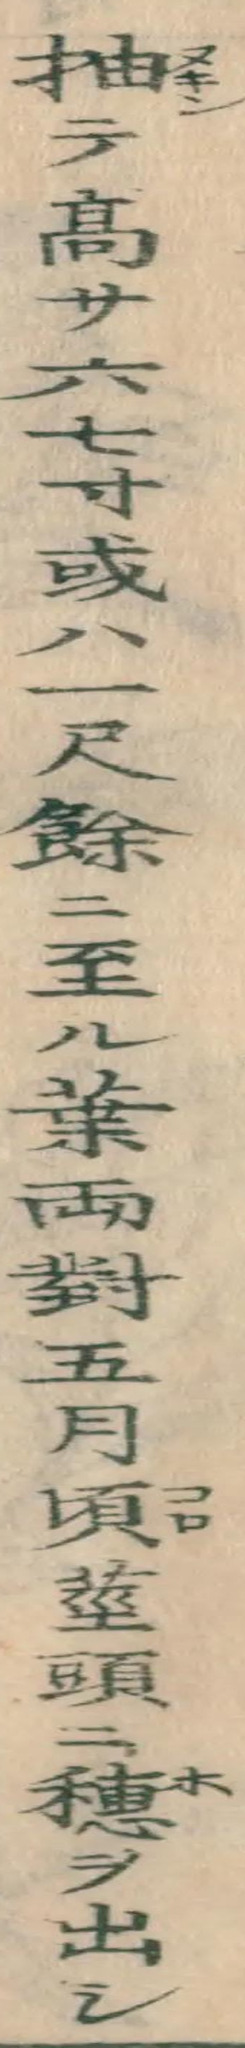抽テ高サ六七寸或ハ一尺余ニ至ル葉両対五月頃茎頭ニ穂ヲ出シ
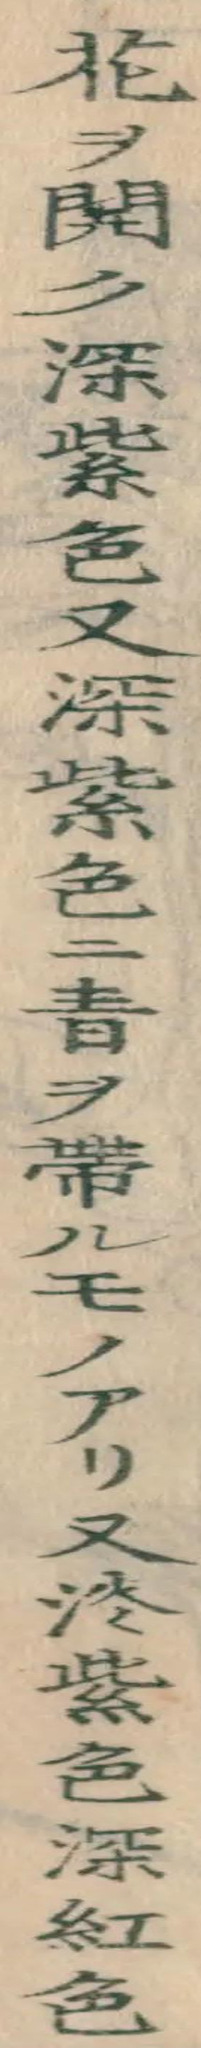花ヲ開ク深紫色又深紫色ニ青ヲ帯ルモノアリ又淡紫色深紅色
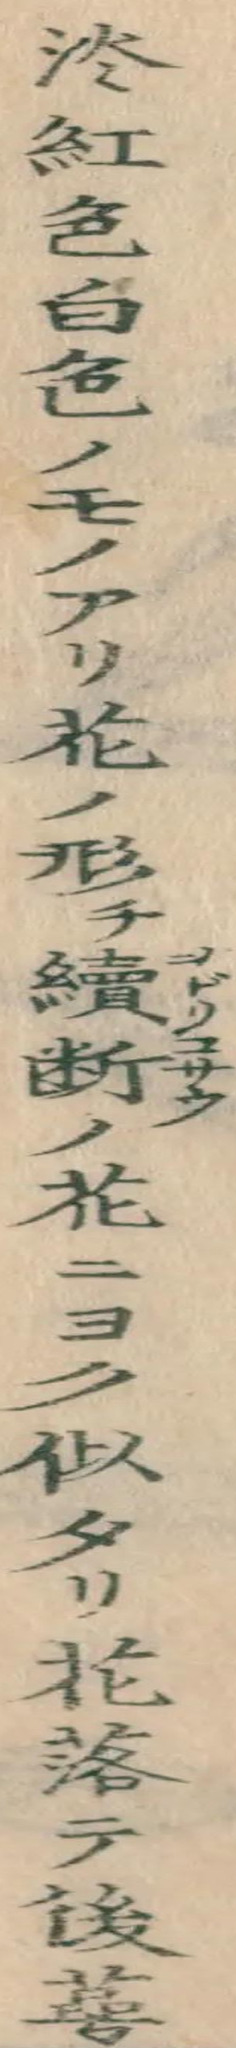淡紅色白色ノモノアリ花ノ形続断ノ花ニヨク似タリ花落テ後萼
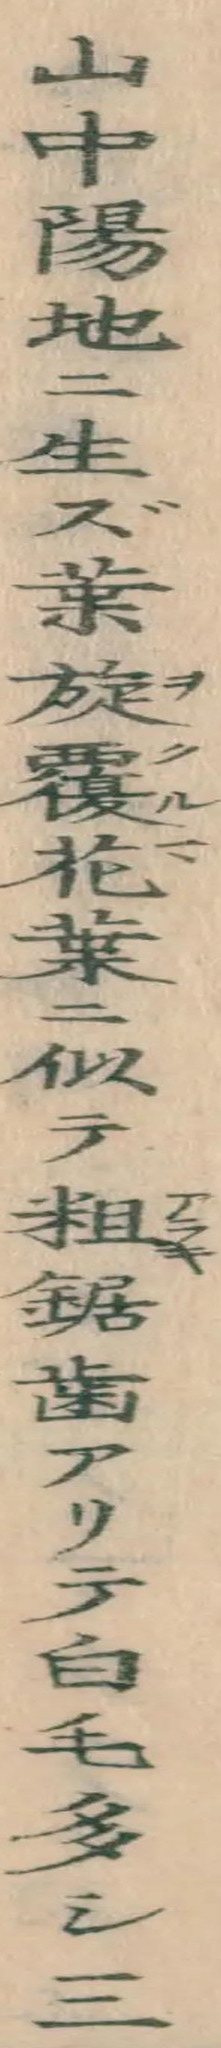山中陽地ニ生ズ葉旋覆花葉ニ似テ粗鋸歯アリテ白毛多シ三
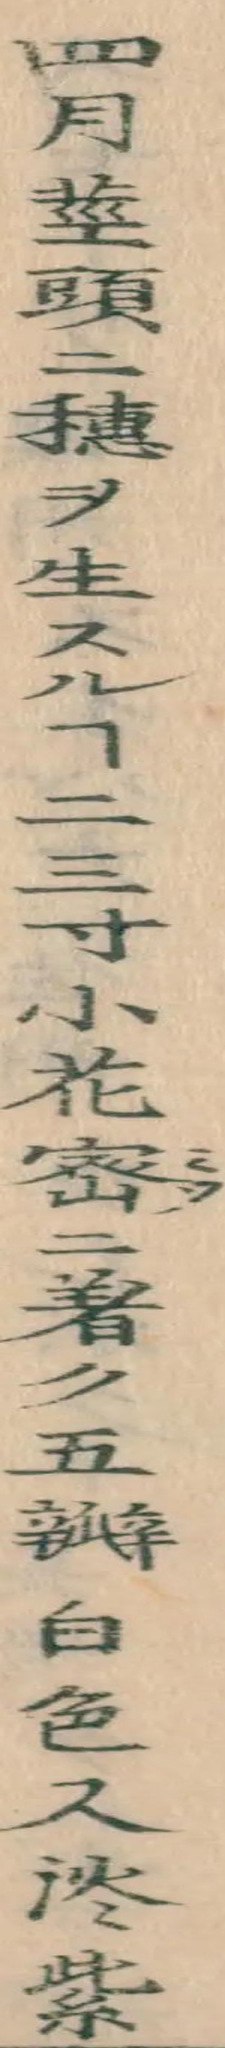四月茎頭ニ穂ヲ生スルコト二三寸小花密ニ着ク五弁白色ス淡紫
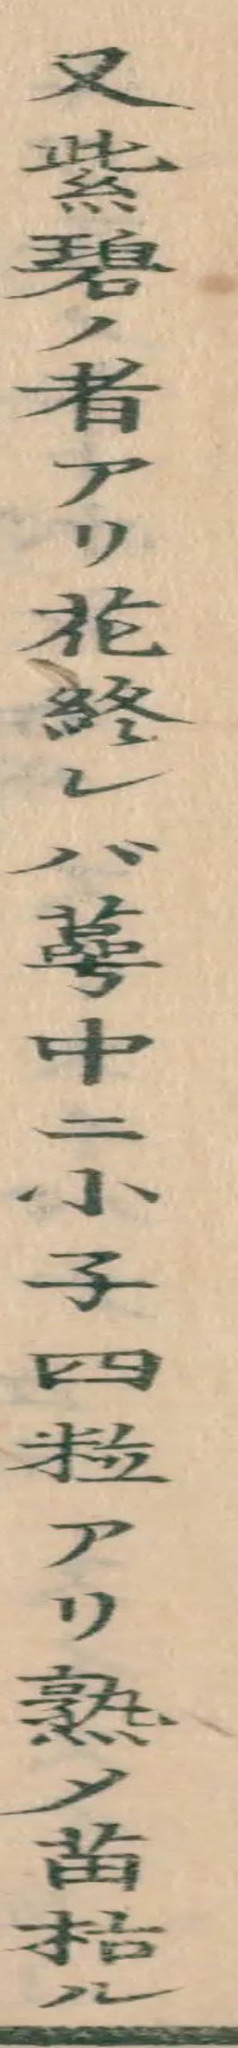又紫碧ノ者アリ花終レバ萼中ニ小子四粒アリ熟シテ苗枯ル
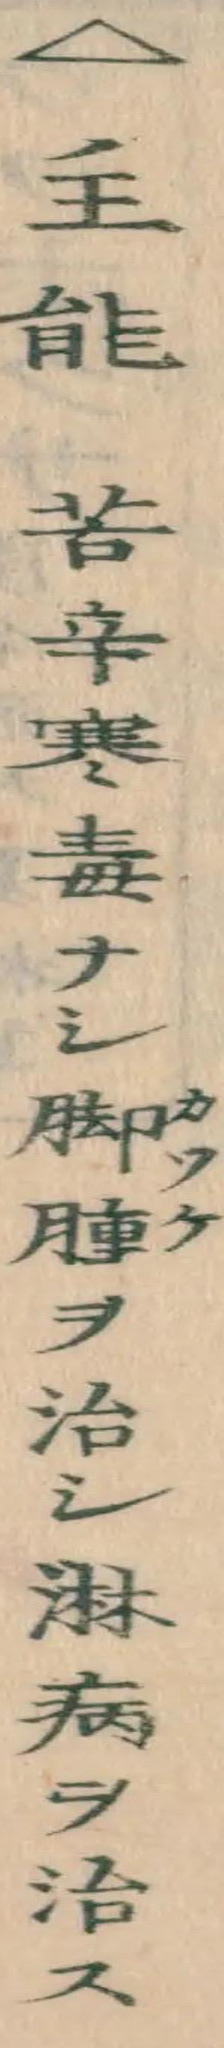△主能苦辛寒毒ナシ脚腫ヲ治シ淋病ヲ治ス
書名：これこれ草 2巻. [2]
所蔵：国立国会図書館 National Diet Library, JAPAN
